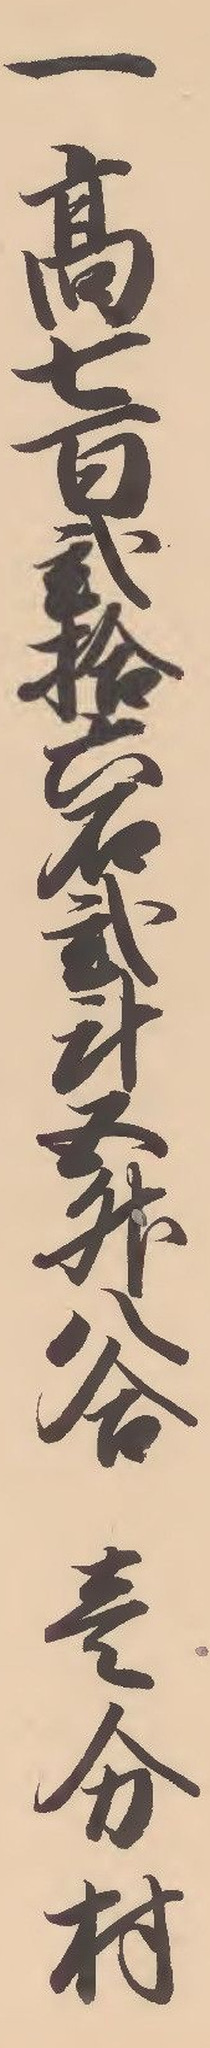一高七百弐拾六石弐斗五升八合壱分村
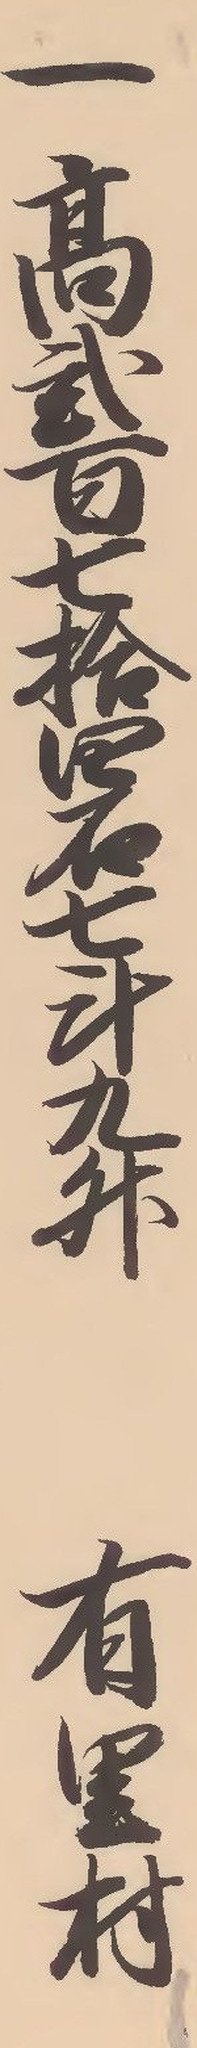一高弐百七拾四石七斗九升有里村
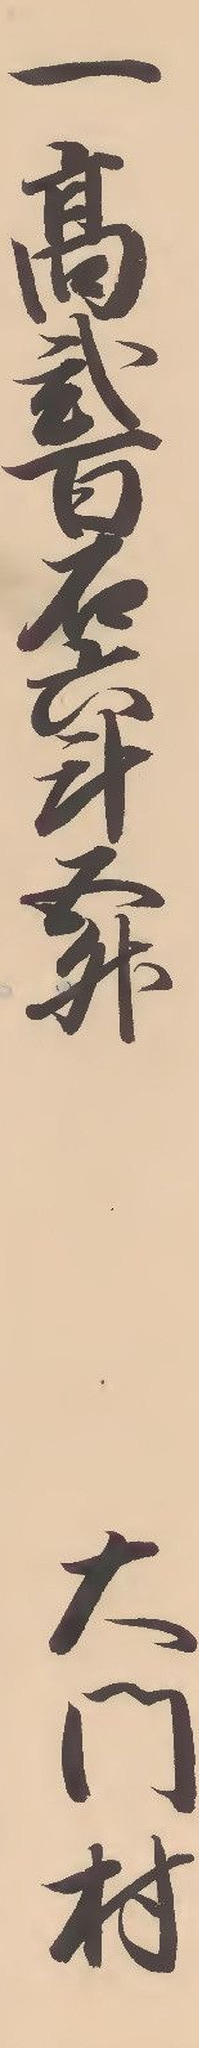一高弐百石六斗五升大門村
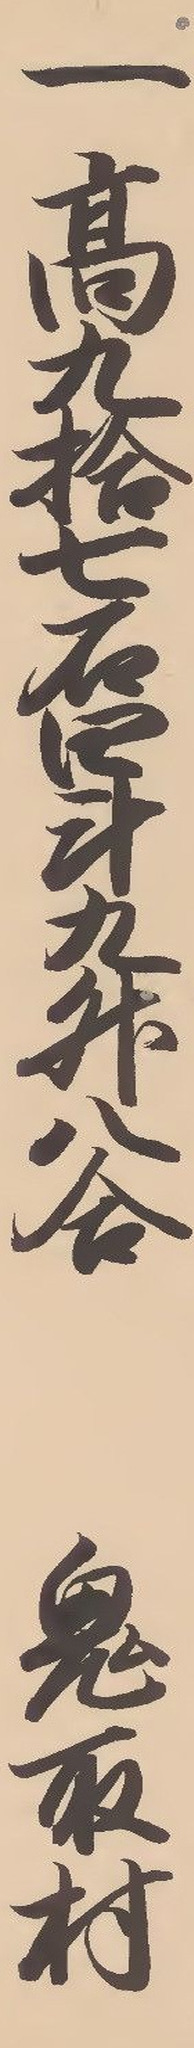一高九拾七石四斗九升八合鬼取村
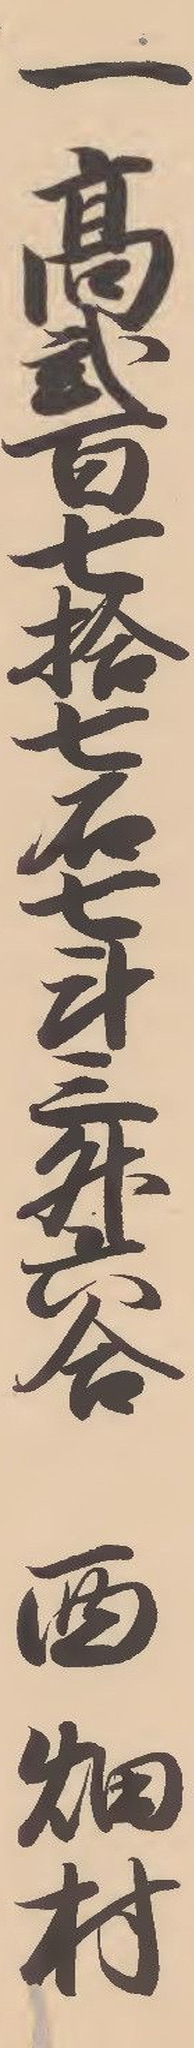一高弐百七拾七石七斗三升六合西畑村
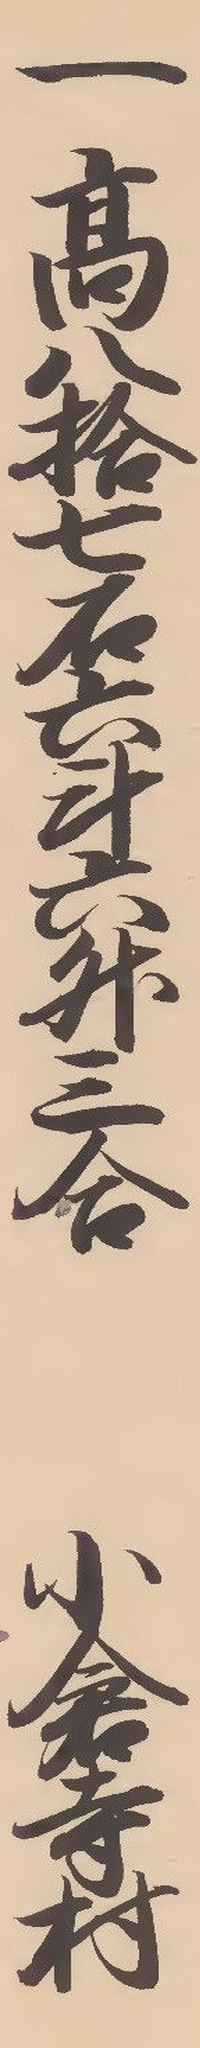一高八拾七石六斗六升三合小倉寺村
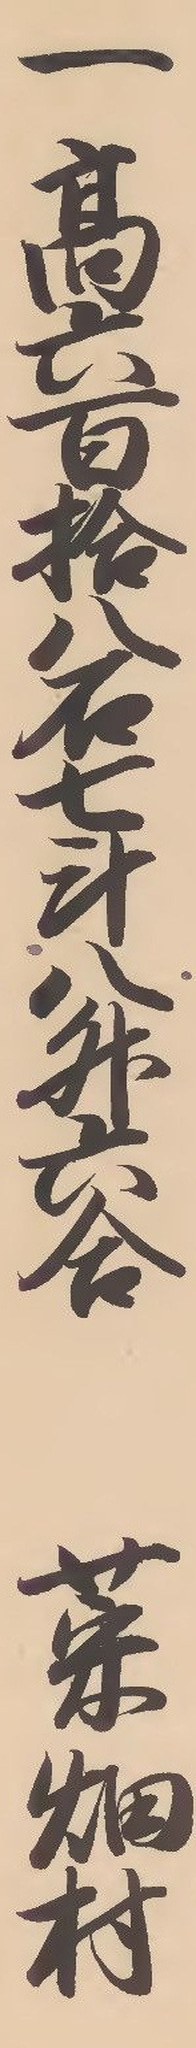一高六百拾八石七斗八升六合菜畑村

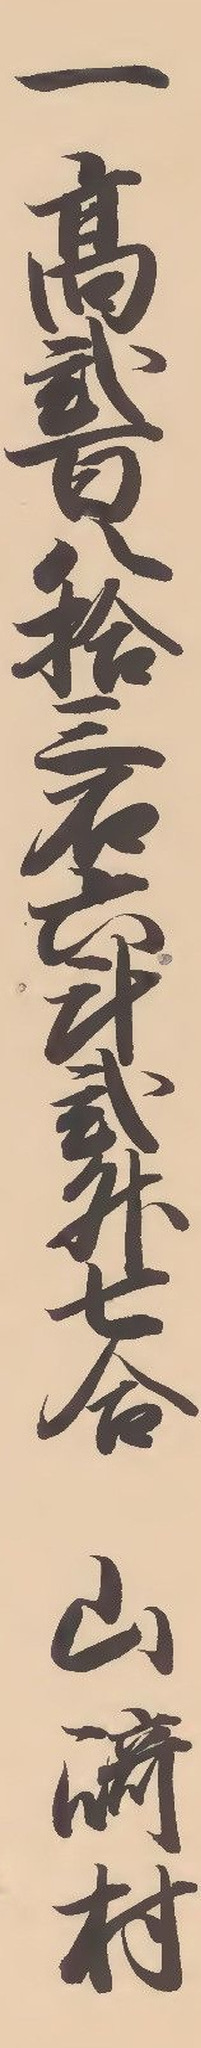一高弐百八拾三石六斗弐升七合山崎村
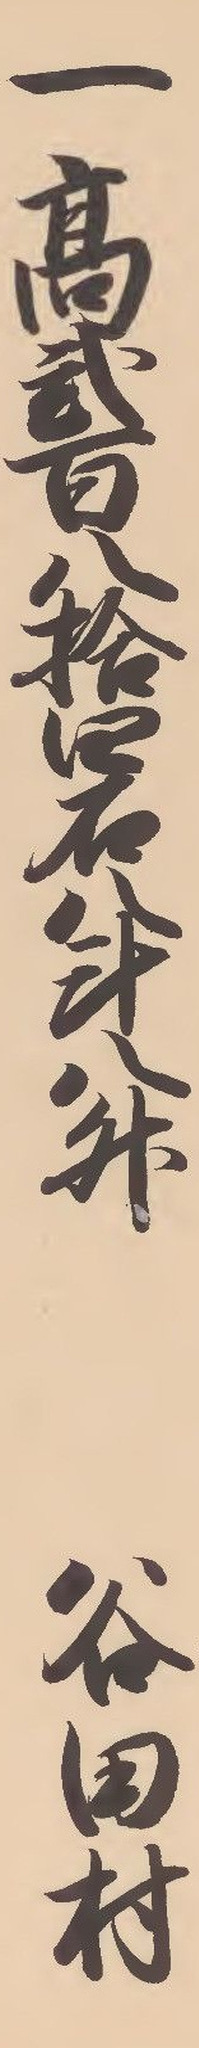一高弐百八拾四石八斗八升谷田村
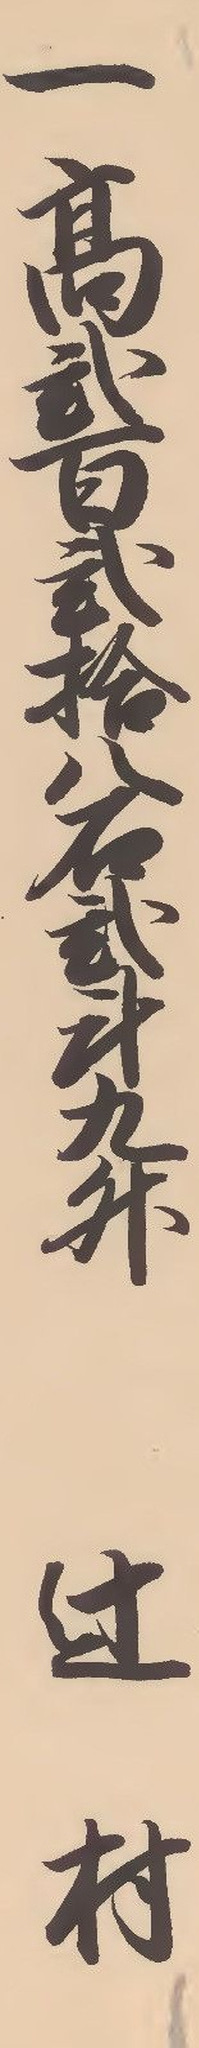一高弐百弐拾八石弐斗九升辻村
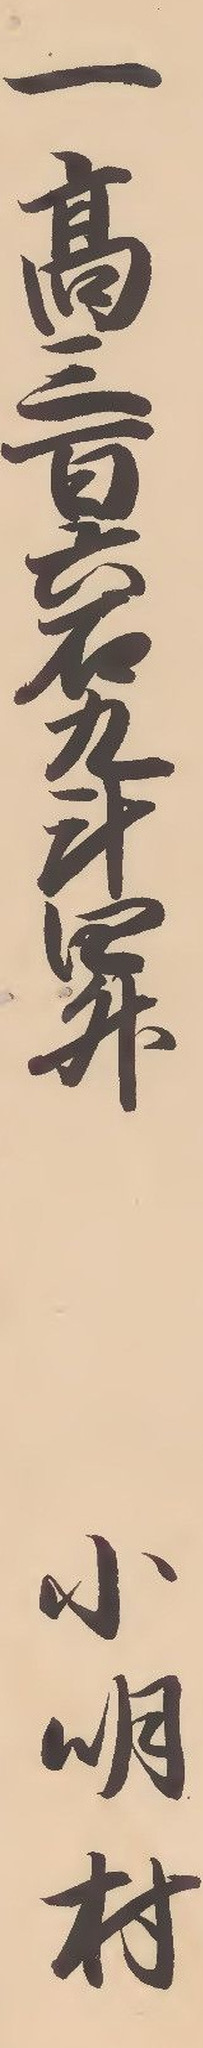一高三百六石九斗四升小明村
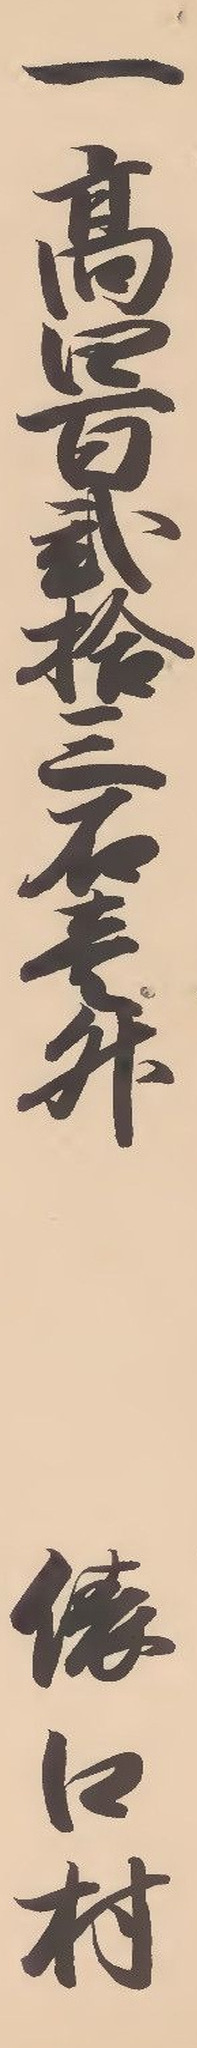一高四百弐拾三石壱升俵口村
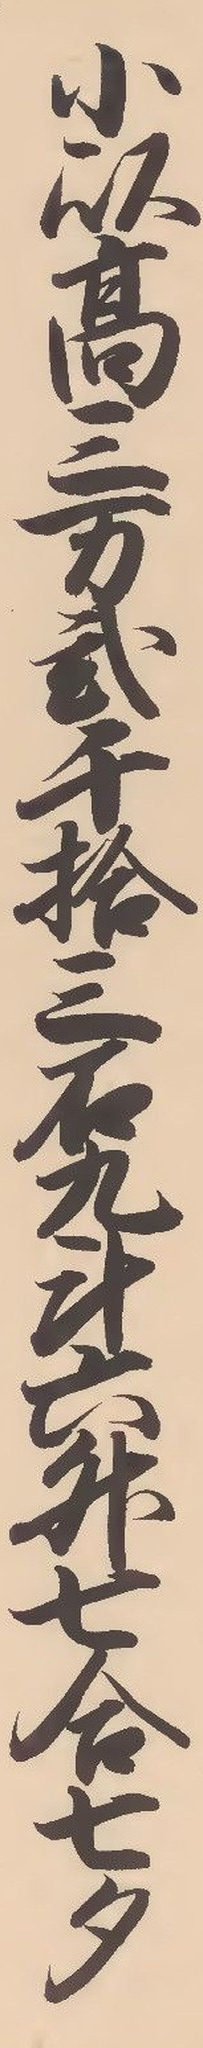小以高三万弐千拾三石九斗六升七合七勺

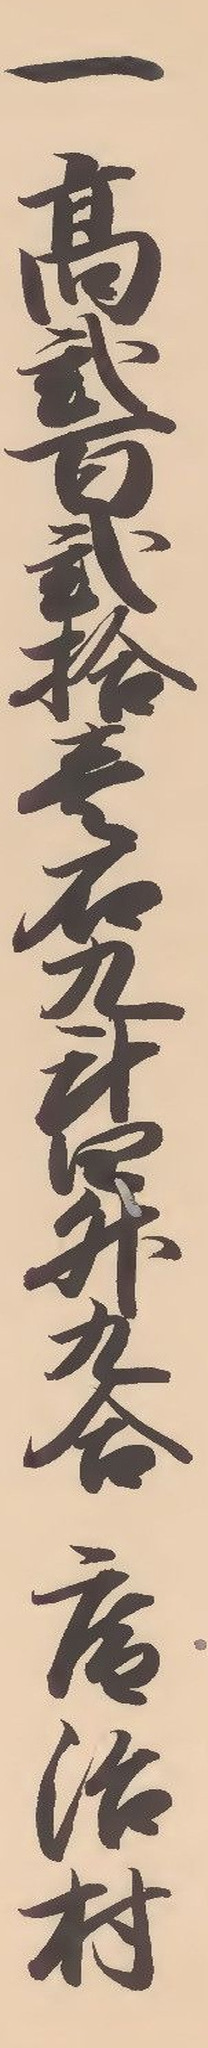一高弐百弐拾壱石九斗四升九合庵治村
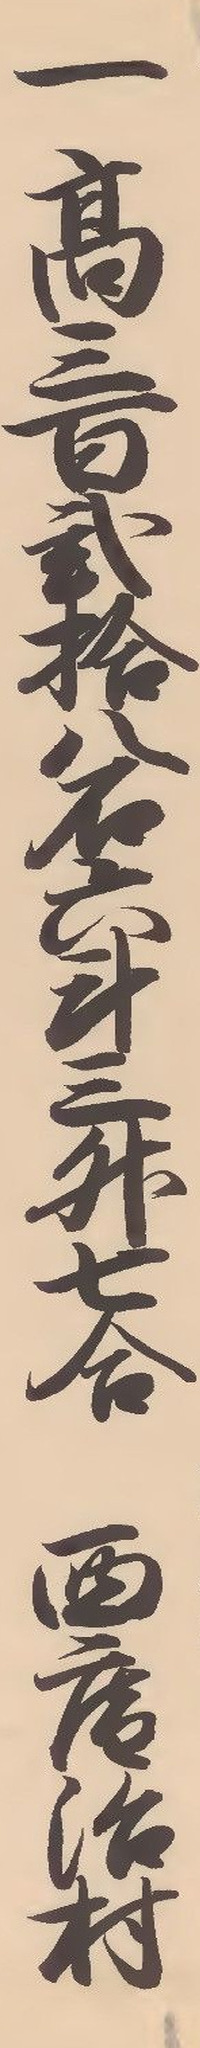一高弐百弐拾壱石九斗四升九合庵治村
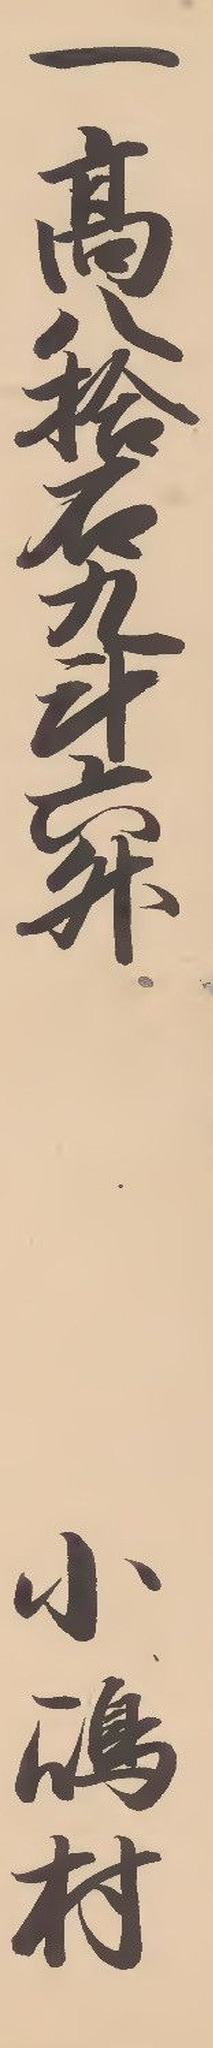一高八拾石九斗六升小島村
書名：大和国郷帳
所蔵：国立公文書館 National Archives of Japan
